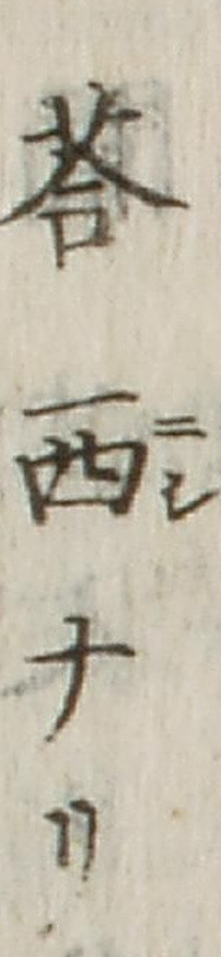答西ナリ
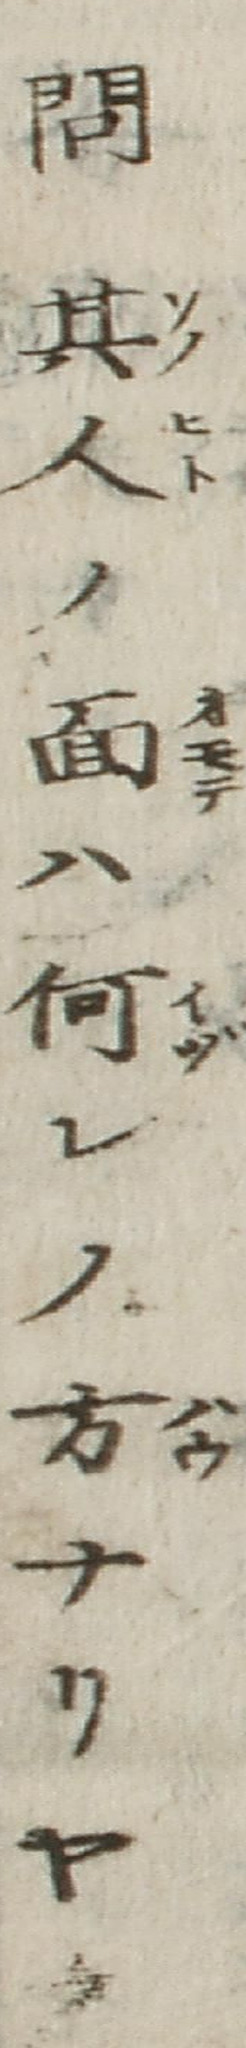問其人ノ面ハ何レノ方ナリヤ

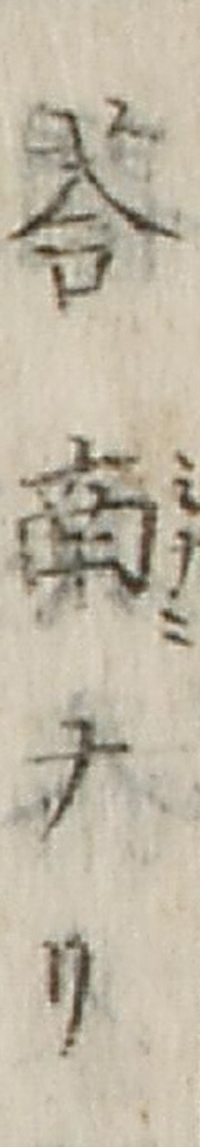答南ナリ
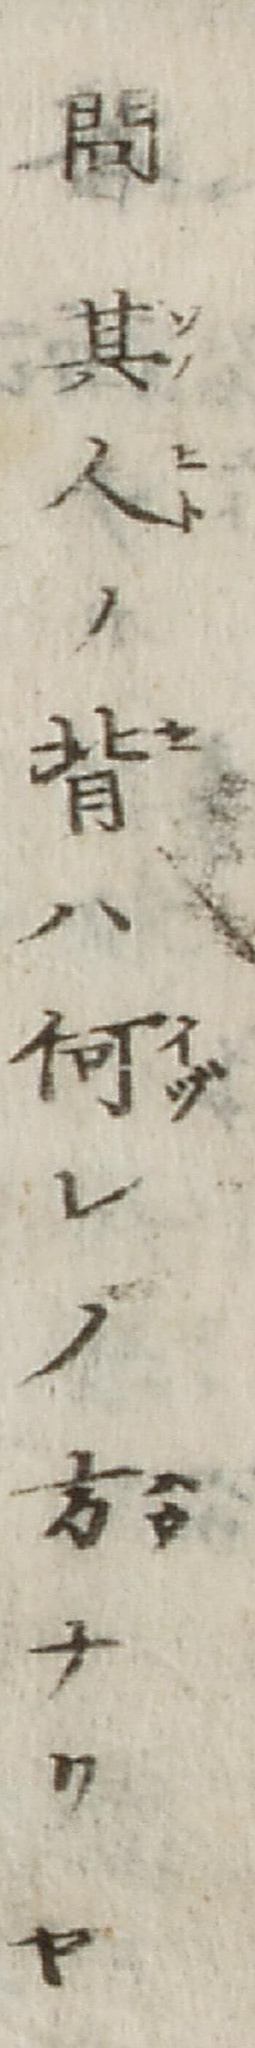問其人ノ背は何レノ方ナリヤ
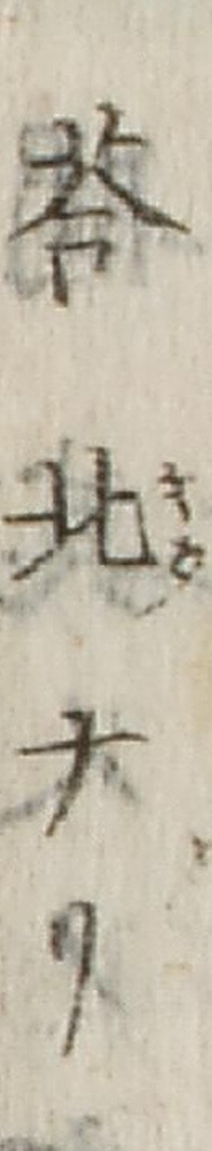答北ナリ
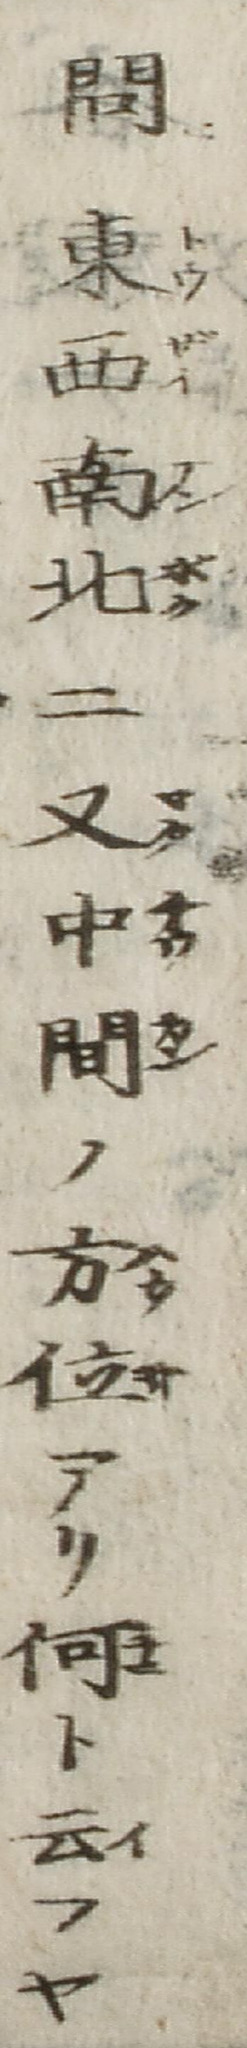問東西南北ニ又中間ノ方位アリ何ト云フヤ
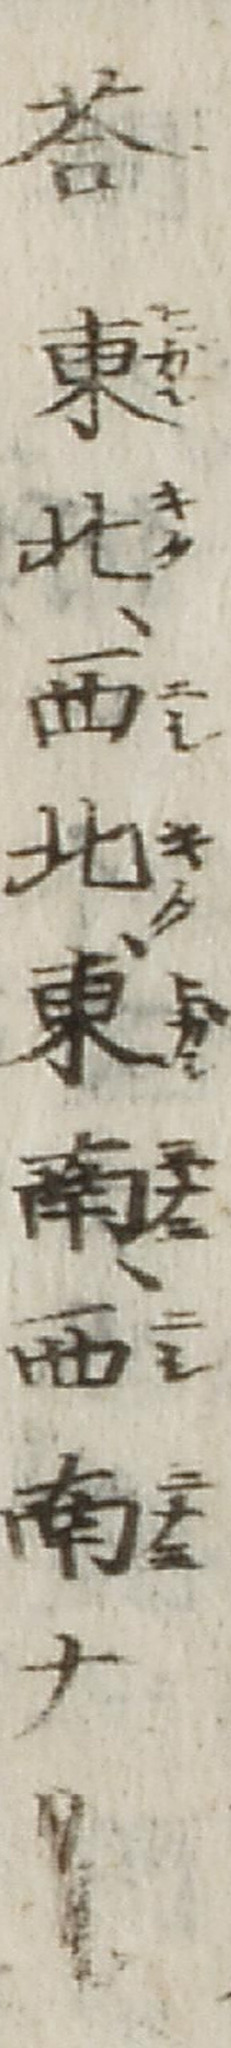答東北、西北、東南、西南ナリ
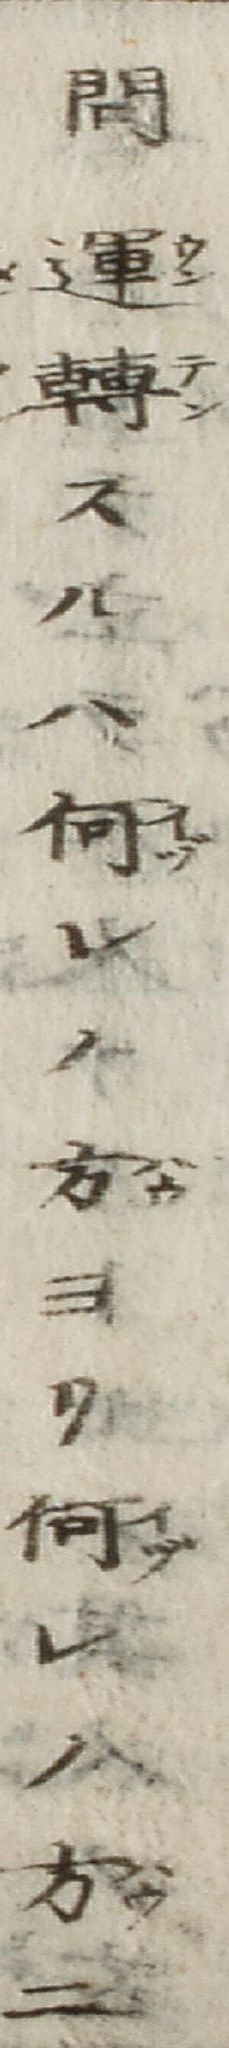問運転スルハ何レノ方ヨリ何レノ方ニ
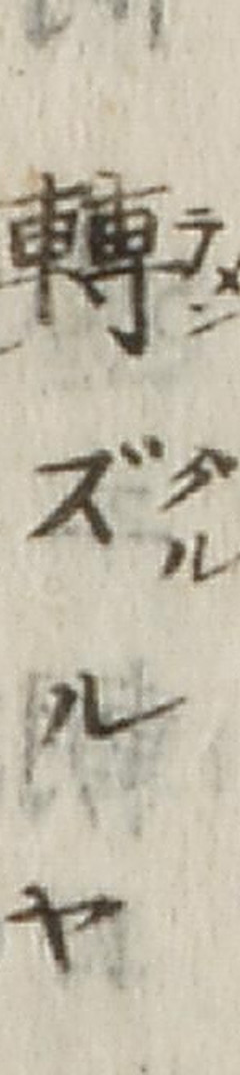転ズルヤ
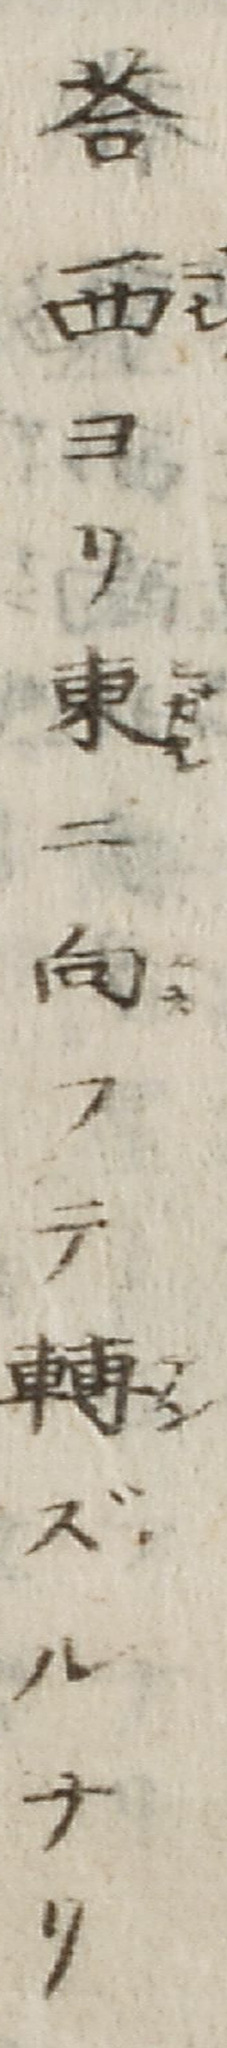答西ヨリ東ニ向フテ転ズルナリ
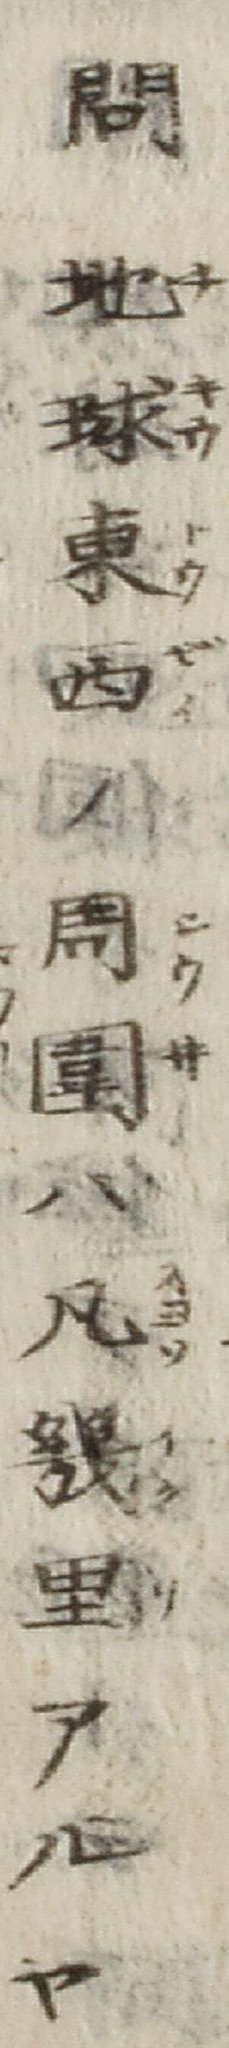問地球東西ノ周囲ハ凡幾里アルヤ
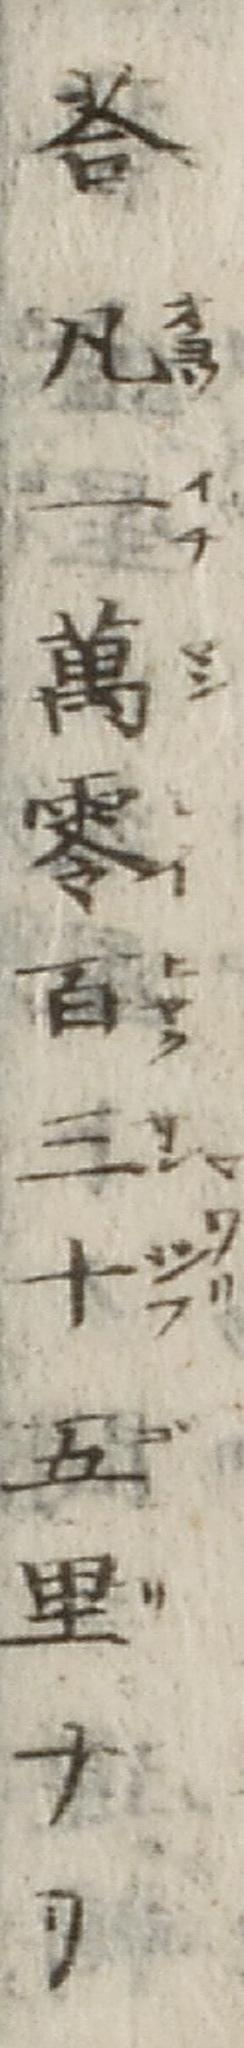答凡一万零百三十五里ナリ
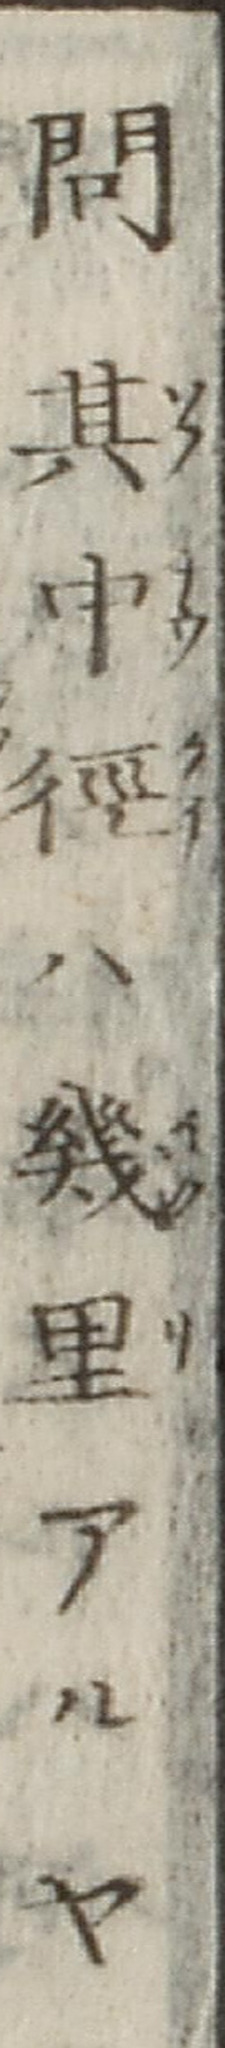問其中径ハ幾里アルヤ
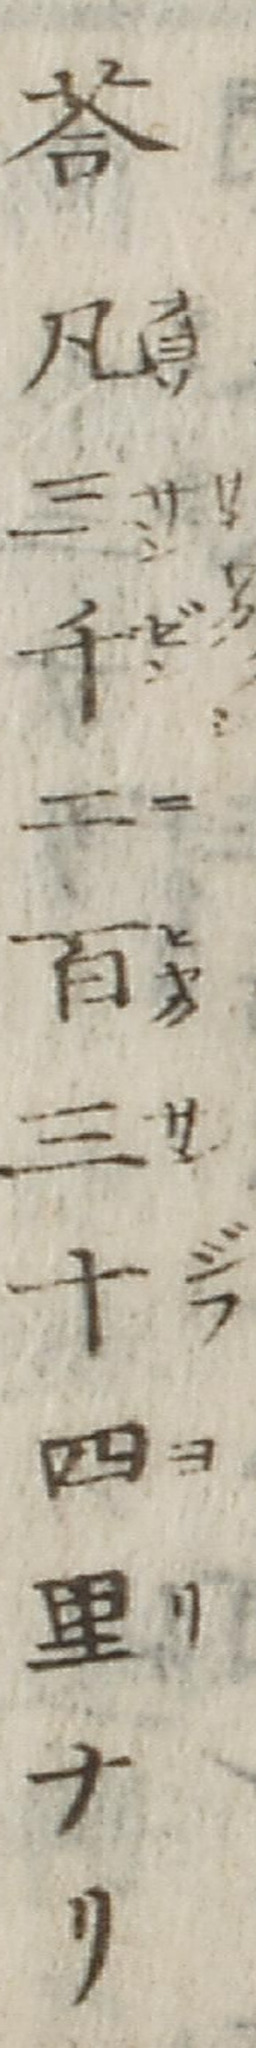答凡三千二百三十四里ナリ
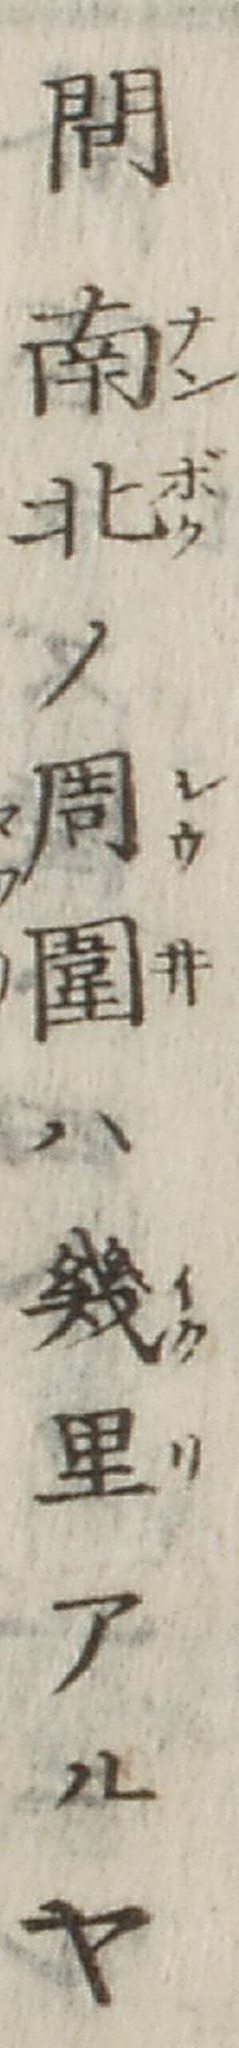問南北ノ周囲ハ幾里アルヤ
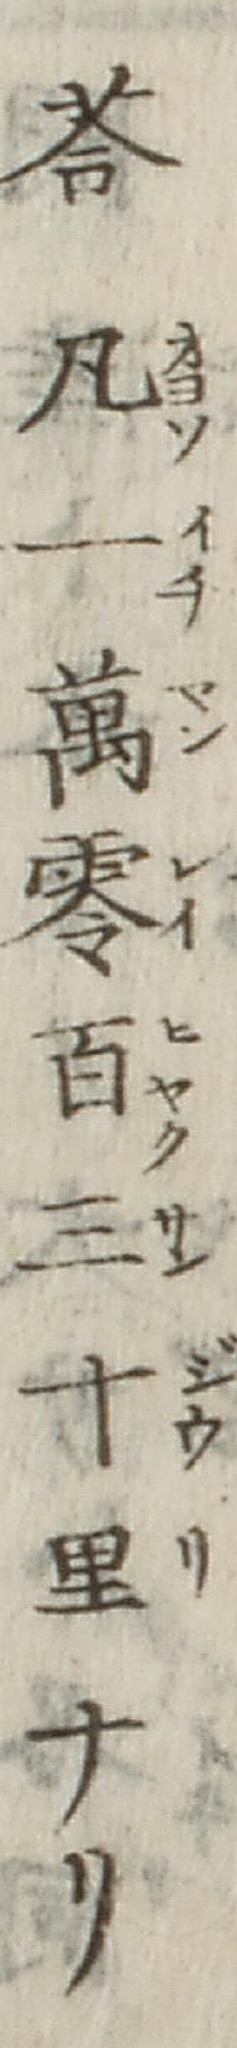答凡一万零百三十里ナリ
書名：地球儀問答　全
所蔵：東京大学地震研究所図書室 Earthquake Research Institute Library, The University of Tokyo, JAPAN
